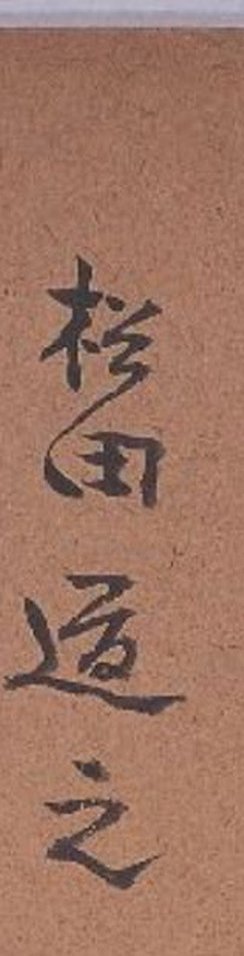松田道之
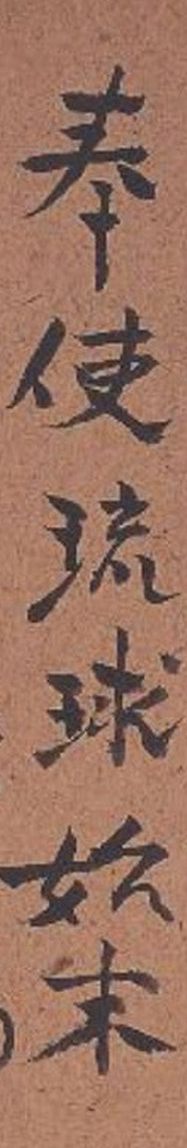奉使琉球始末
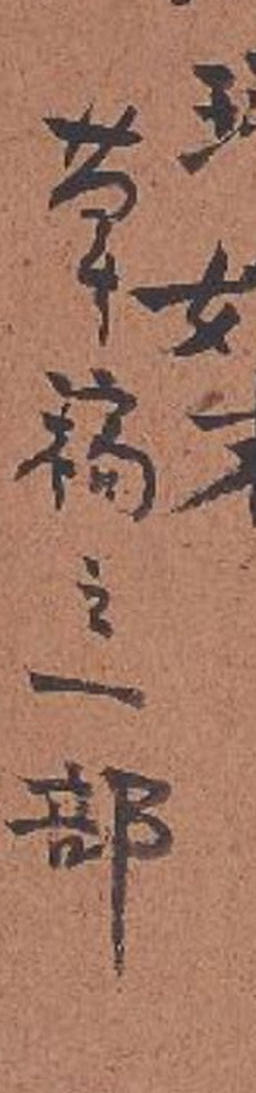草稿之一部

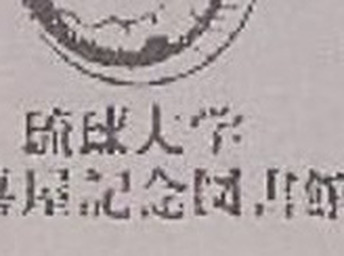琉球大学
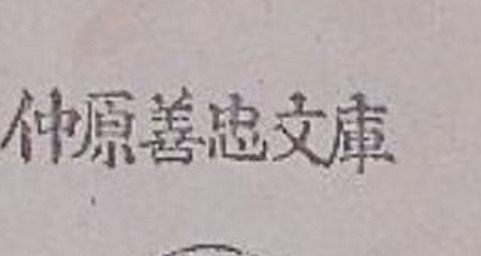仲原善忠文庫
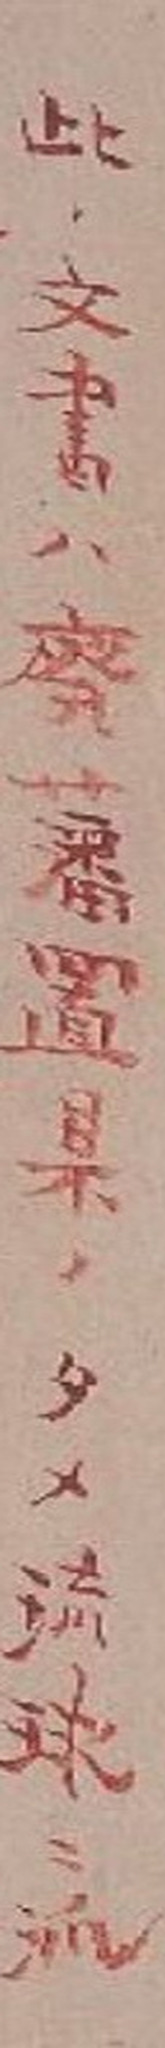此ノ文書ハ廃藩置県ノタメ琉球ニ派
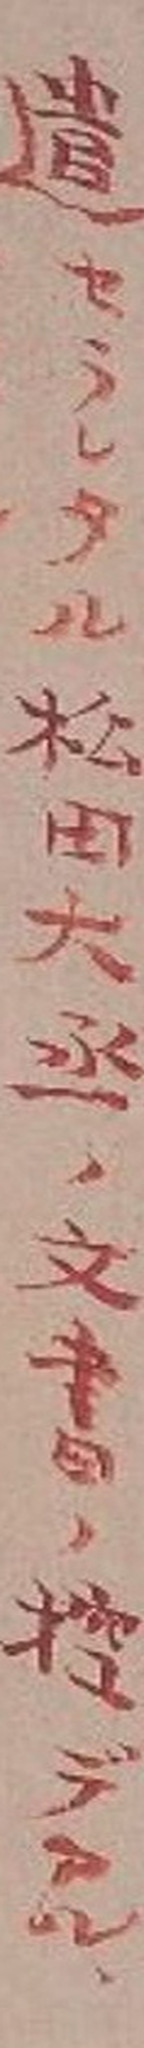遣セラレタル松田大丞ノ文書ノ控デアル、
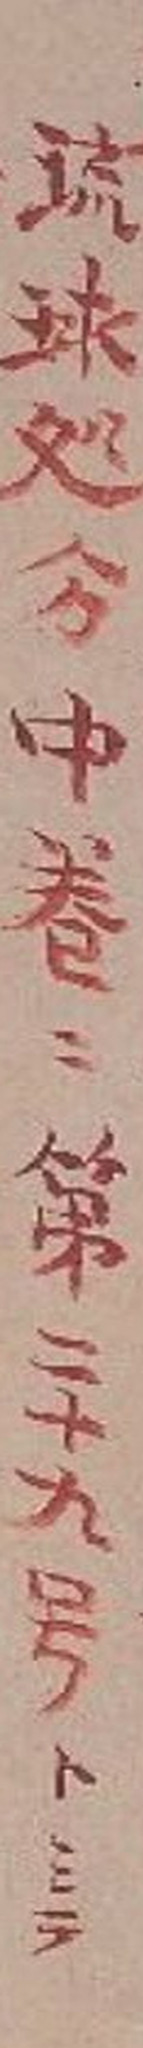琉球処分中巻ニ第二十九号トシテ
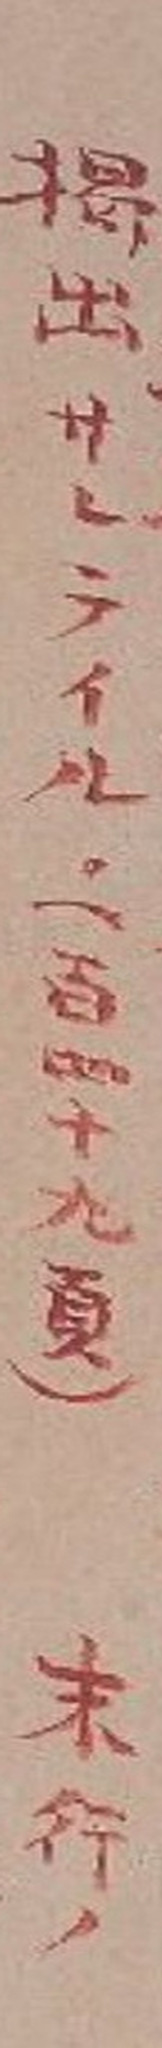提出サレテイル。(百四十九頁)末行ノ
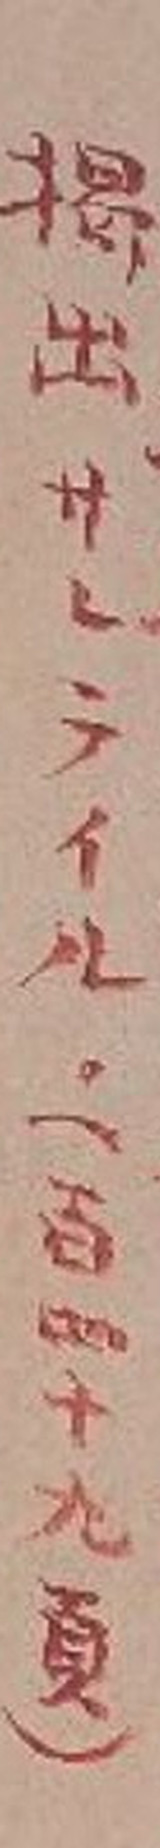提出サレテイル。(百四十九頁)末行ノ
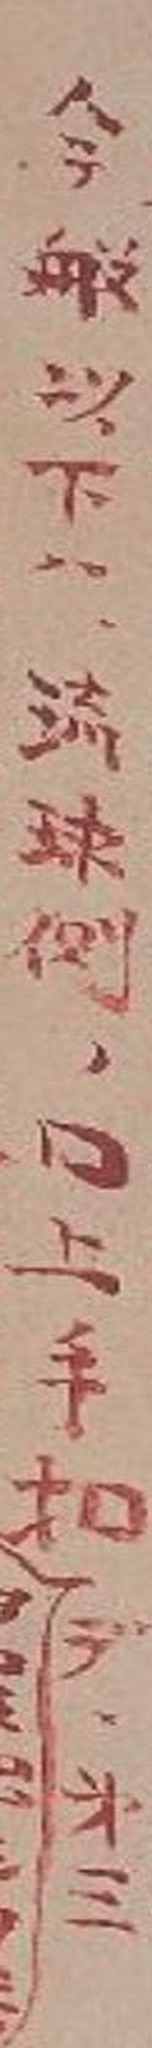今般以下ハ、琉球側ノ口上控デ、第三
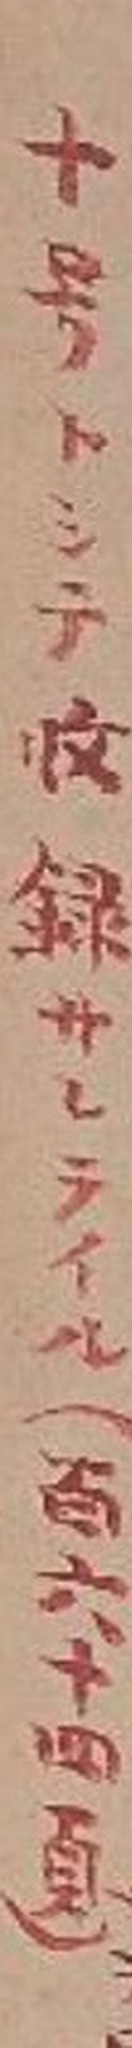十号トシテ収録サレテイル(百六十四頁)

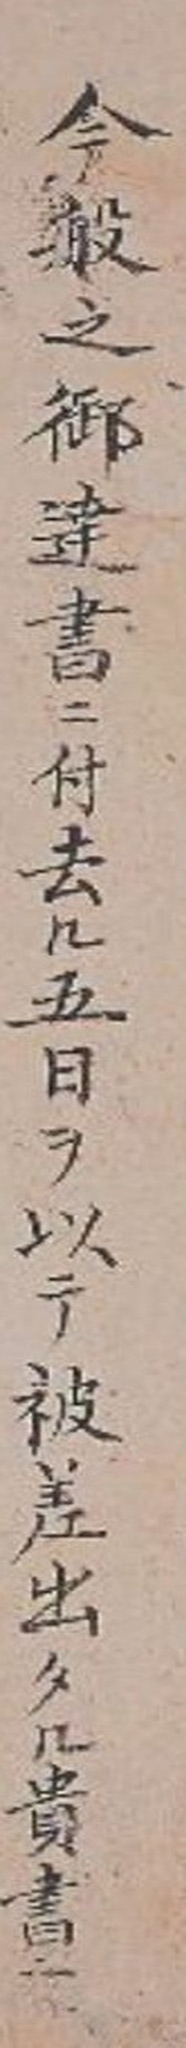今般之、御達書ニ付去ル五日ヲ以テ被差出タル貴書ニ
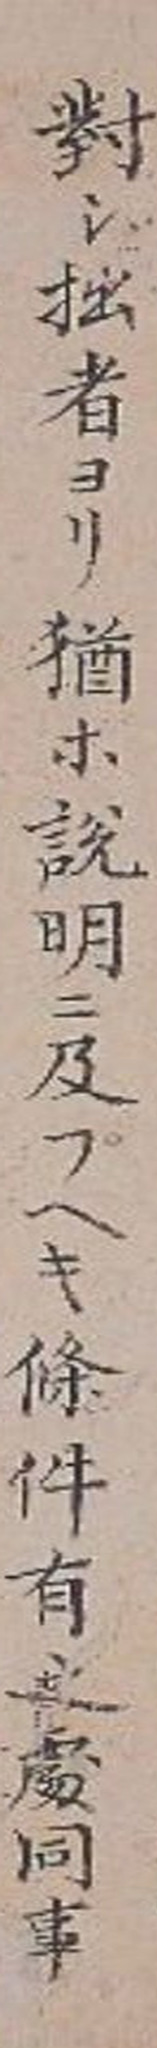対シ拙者ヨリ猶ホ説明ニ及フヘキ条件有之処同事
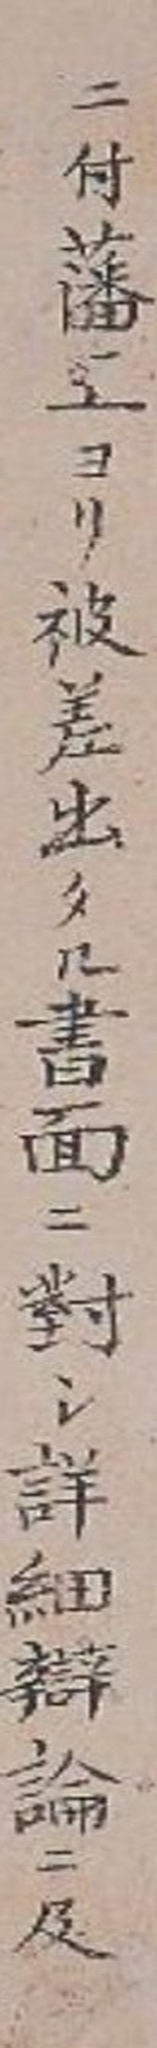ニ付藩王ヨリ被差出タル書面ニ対シ詳細弁論ニ及
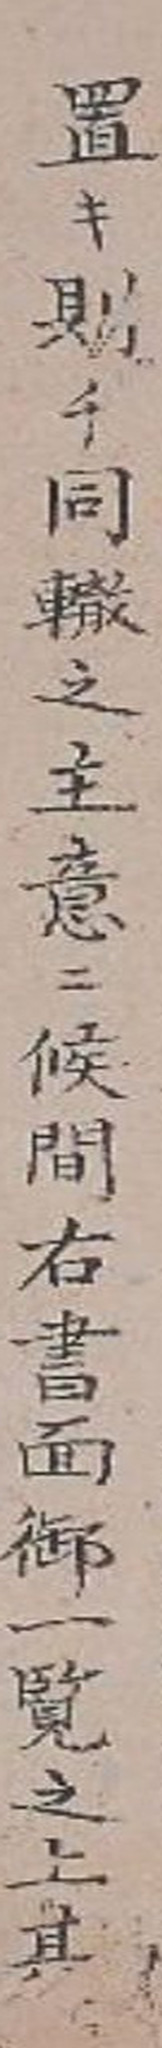置キ則チ同轍之主意ニ候間右書面御一覧之上其
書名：奉使琉球始末 草稿之一部
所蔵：University of the Ryukyus Library
